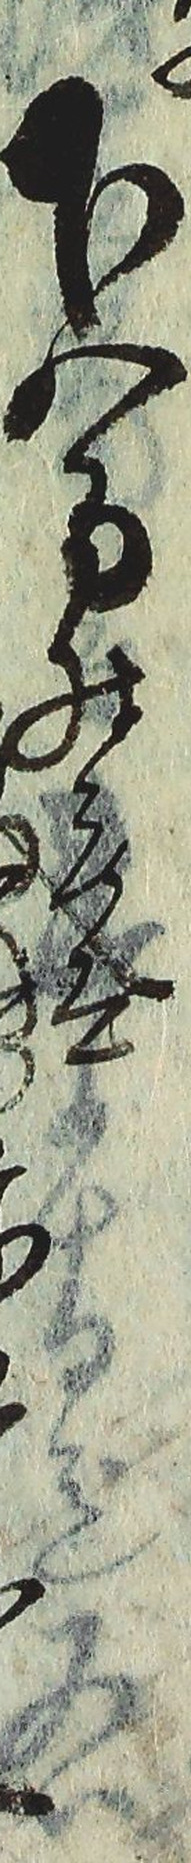下八万村庄屋
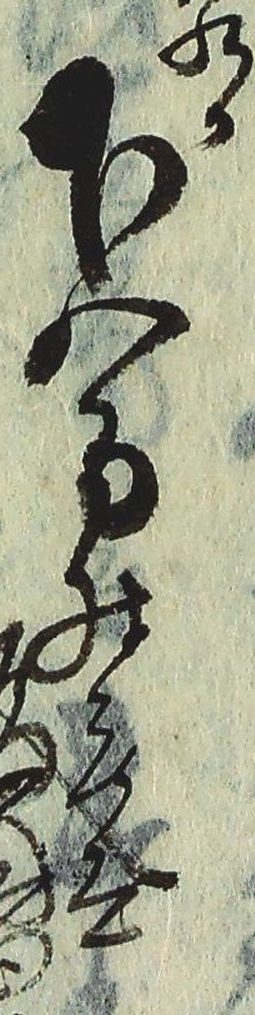下八万村庄屋
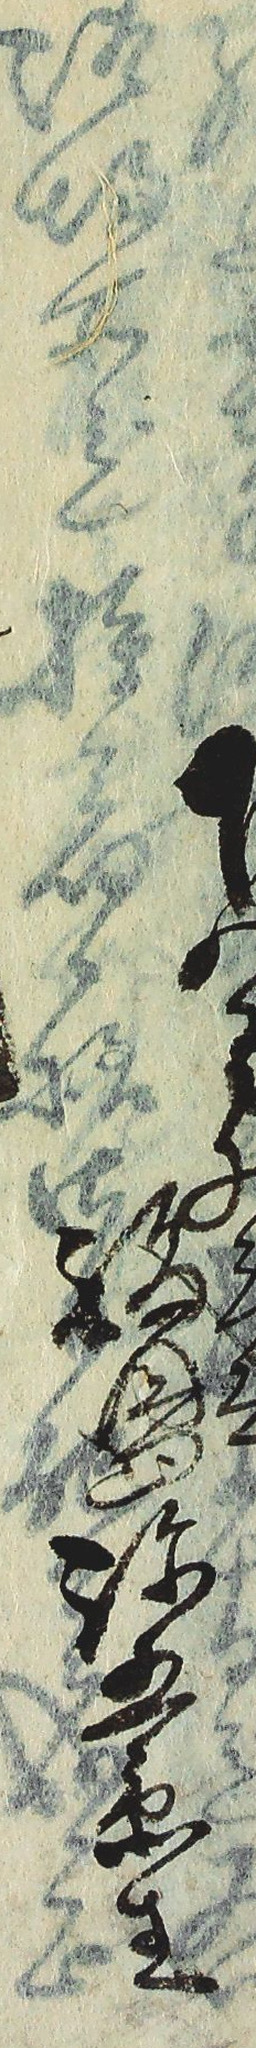福島弥五兵衛方へ
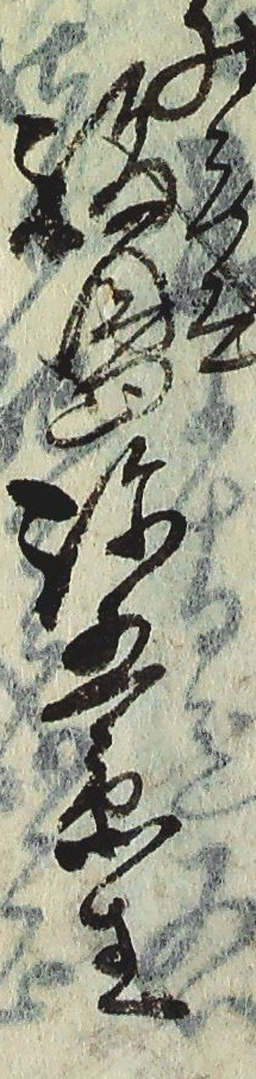福島弥五兵衛方へ
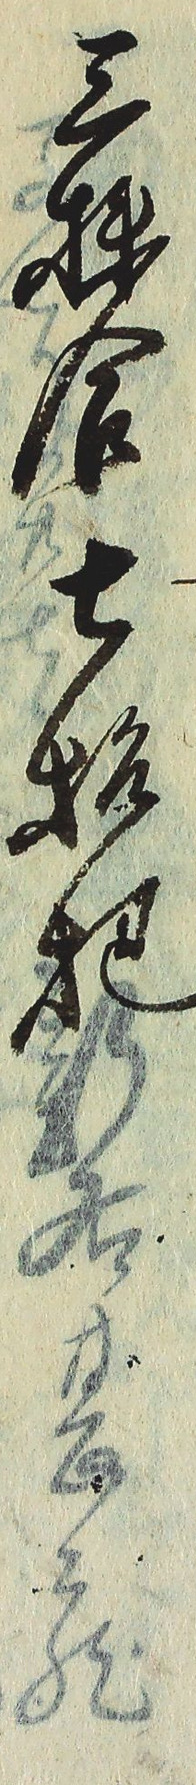三株合七拾把
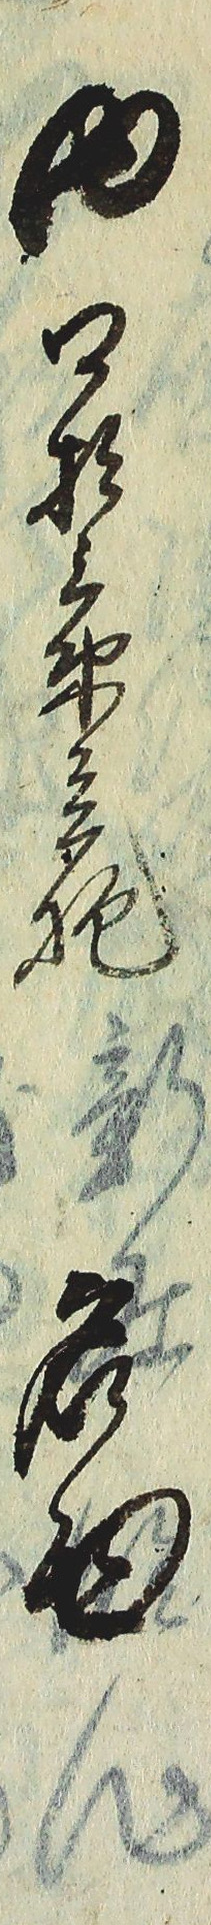内四拾三束壱把名西
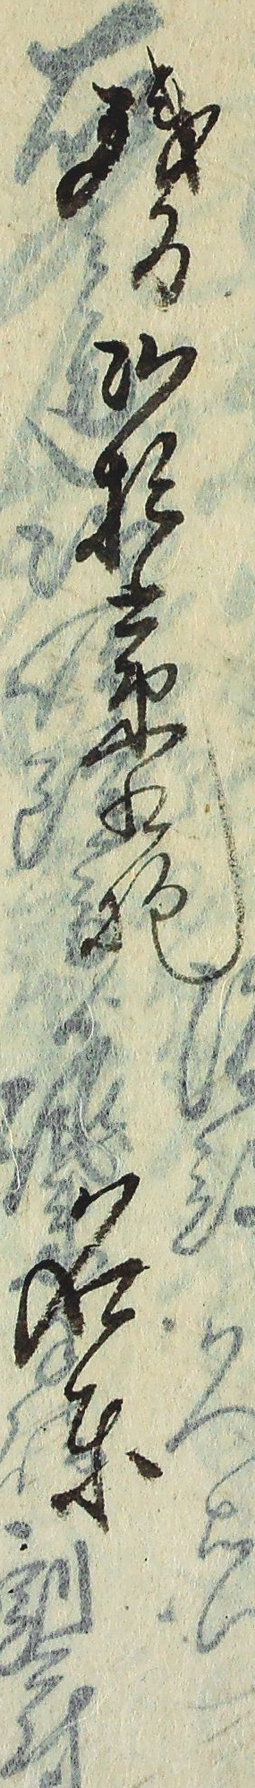残て弐拾六束九把名東
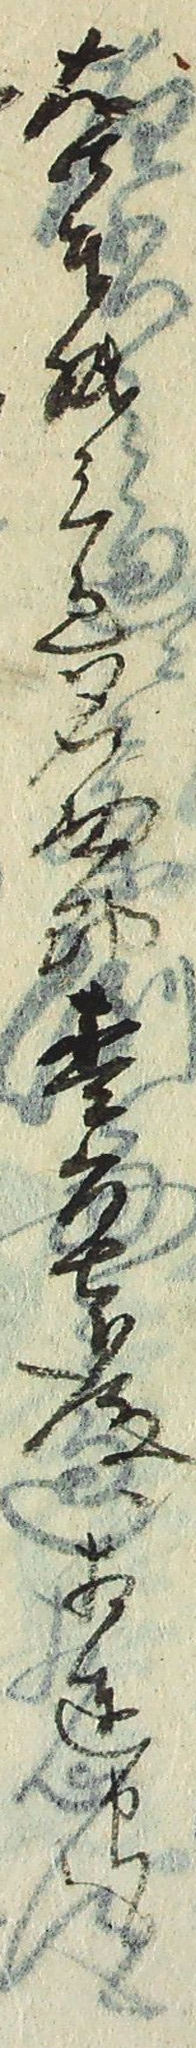右御本紙三通名西郡盛宣七郎殿へ相達申候
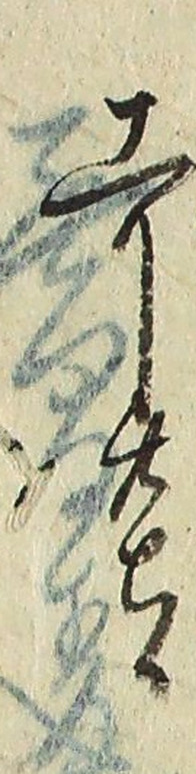十一月廿七日
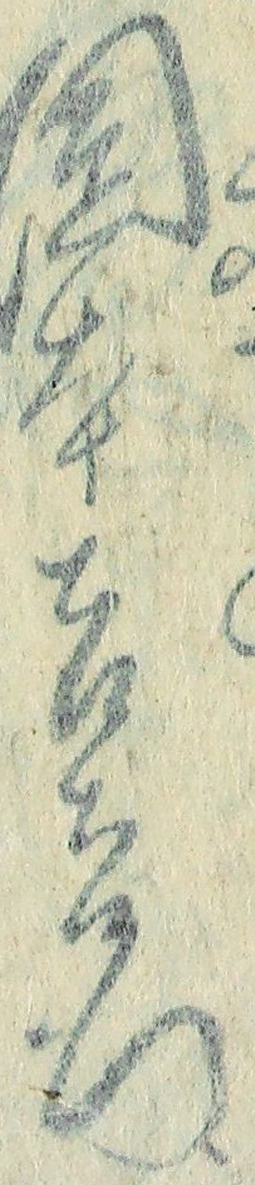岡本吉右衛門

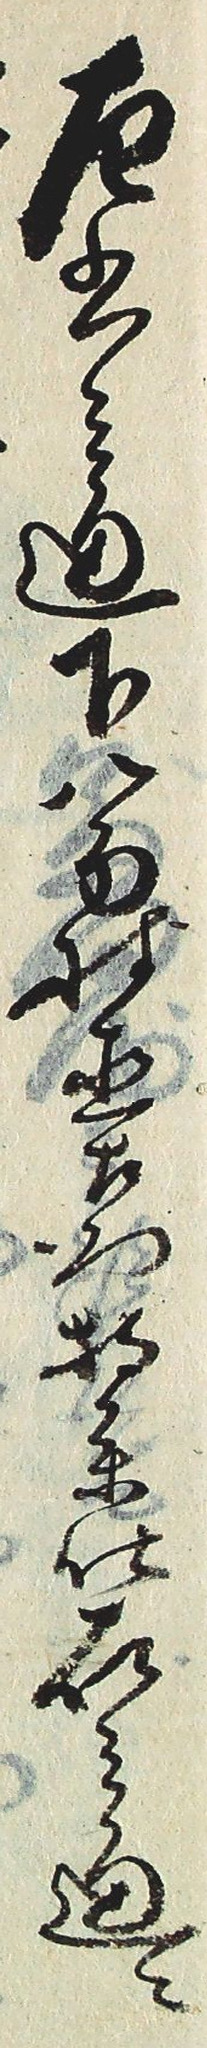左書之通下八万村直左衛門持参仕右之通に
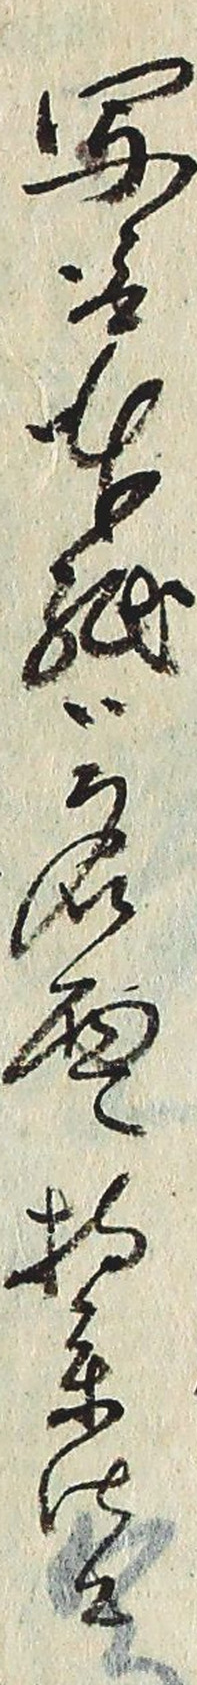写取本紙は名西へ持参仕候
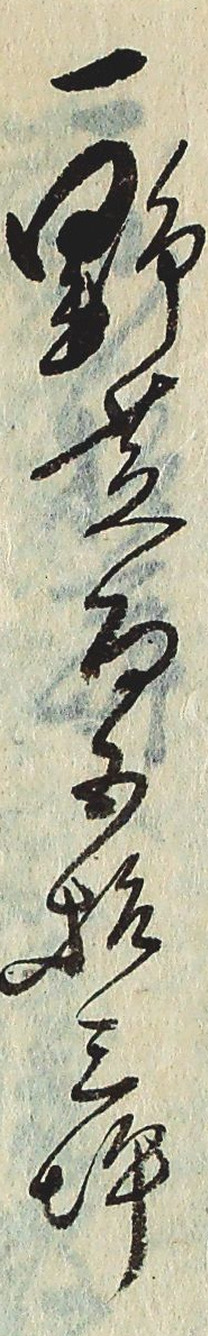一野芝百五拾三坪
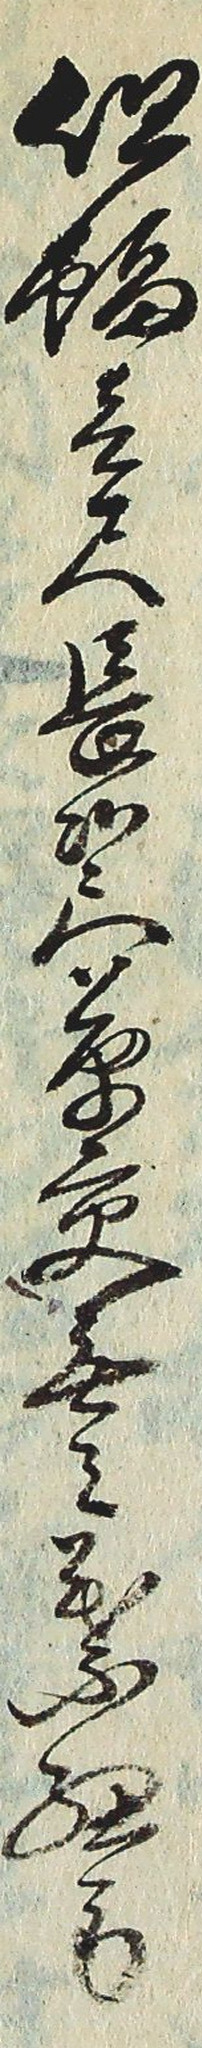但幅壱尺長弐尺草交無之葉細方
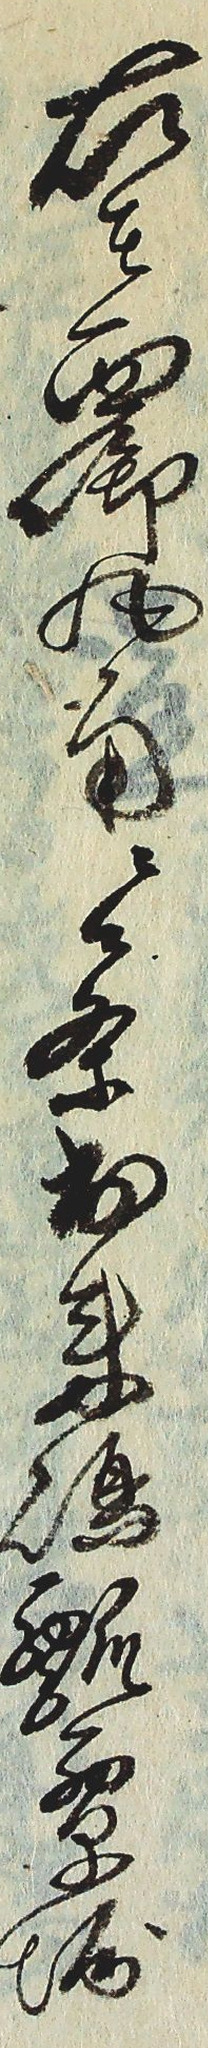右は西御丸御用に候条出来島瓢覃堀
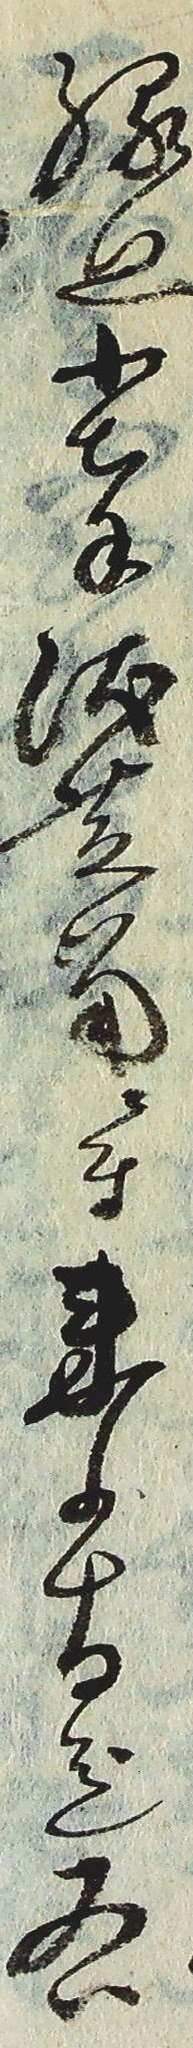縁廻小土手伏芝御用に付来月十日迄右
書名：名東郡中諸割賦元帳
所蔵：鳴門教育大学 Naruto University of Education
